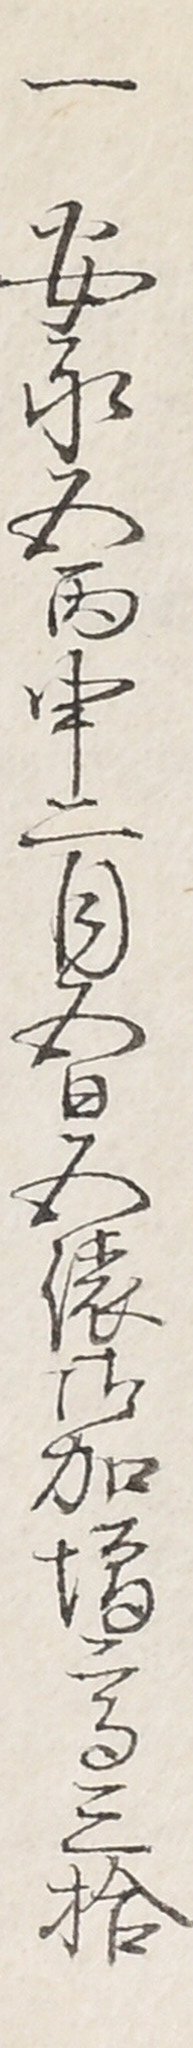一安永五丙申二月五俵御加増高三拾
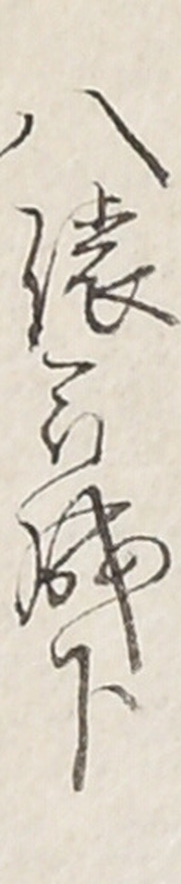八俵被成下
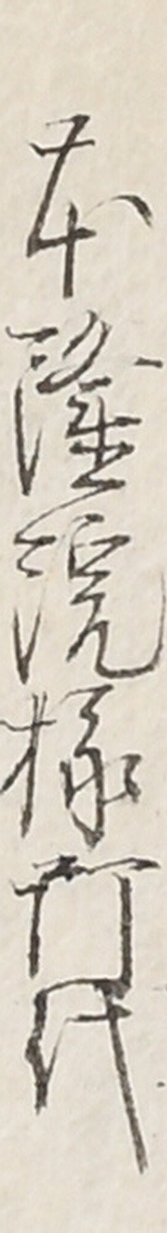本隆院様御代
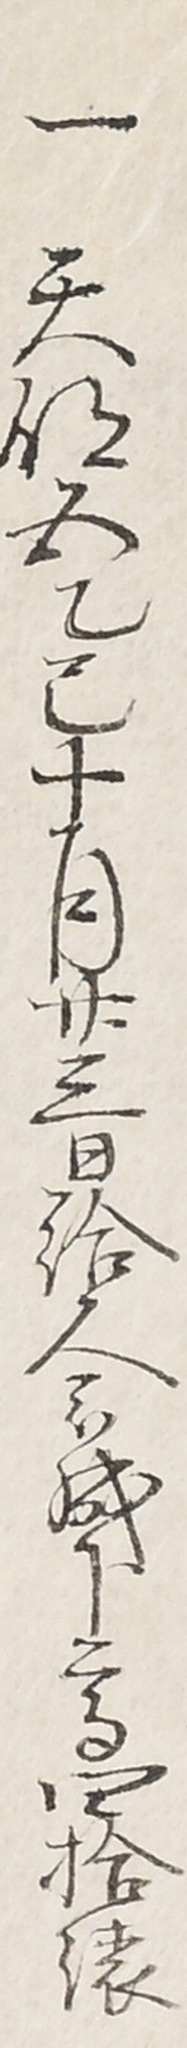一天明五乙巳十月廿三日給人被成下高四拾俵
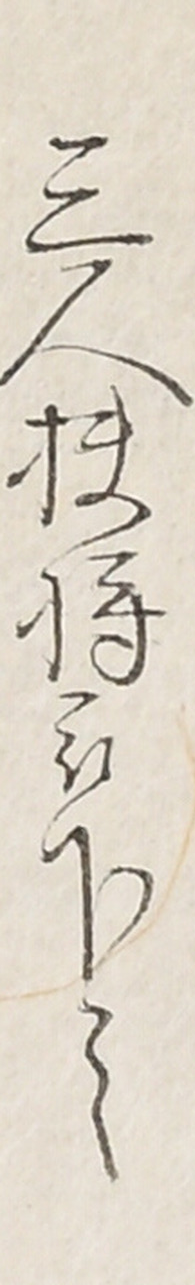三人扶持被下之
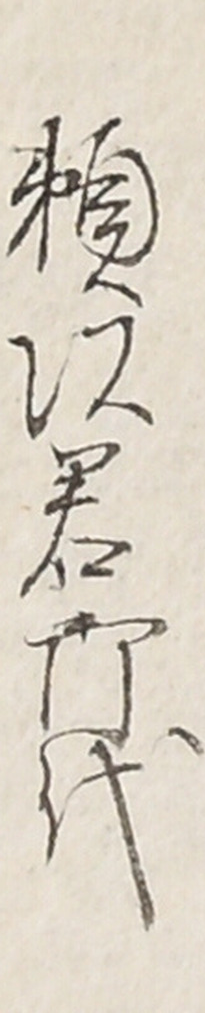頼以君御代
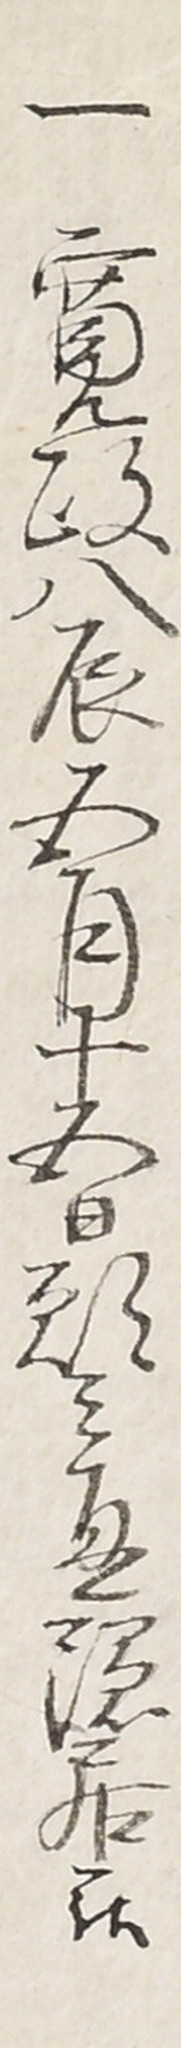一寛政八辰五月十五日願之通隠居被
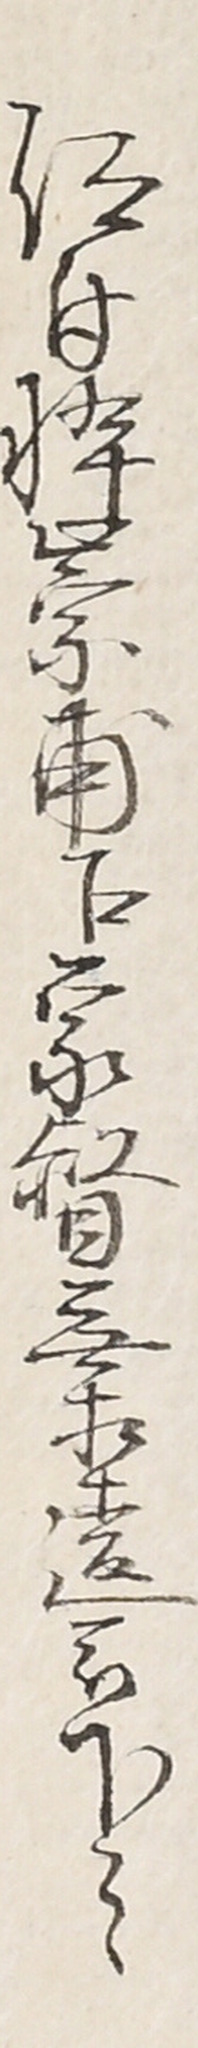仰付忰崇甫江家督無相違被下之
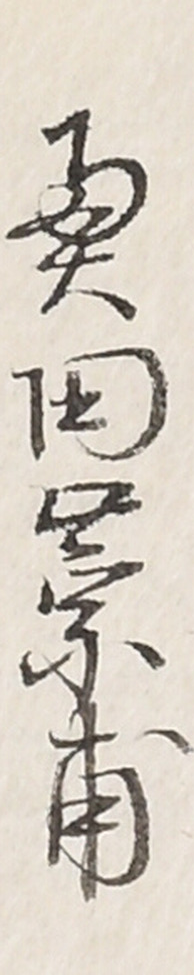奥田崇甫
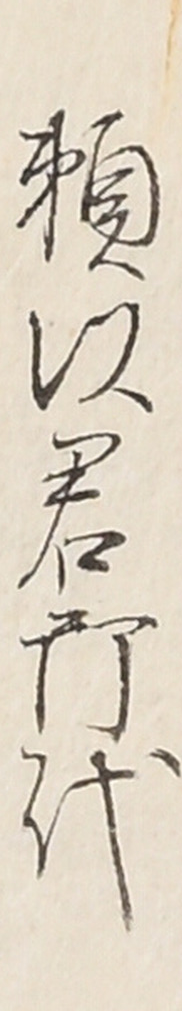頼以君御代
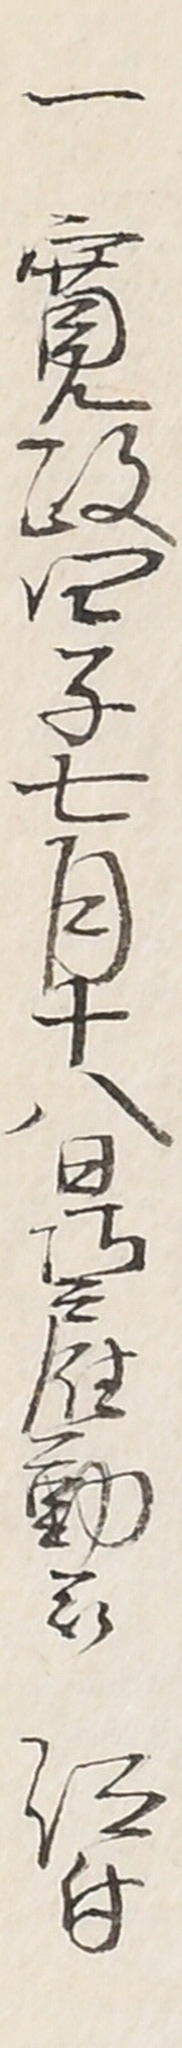一寛政四子七月十八日御雇勤被仰付
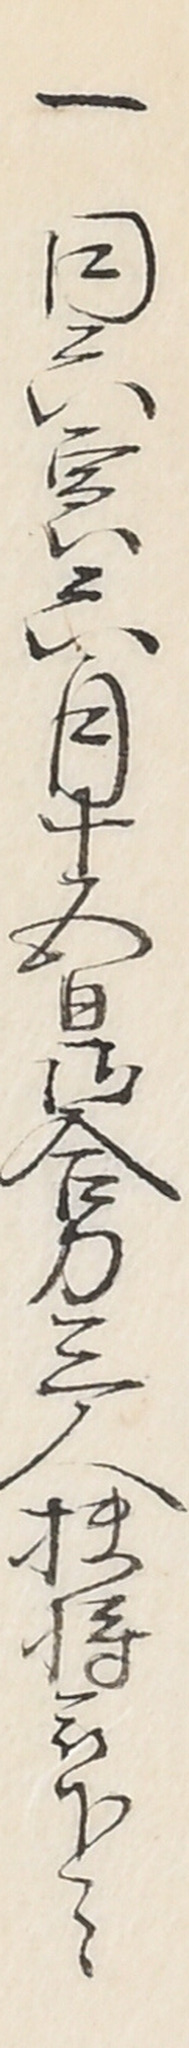一同六寅六月十五日御合力三人扶持被下之
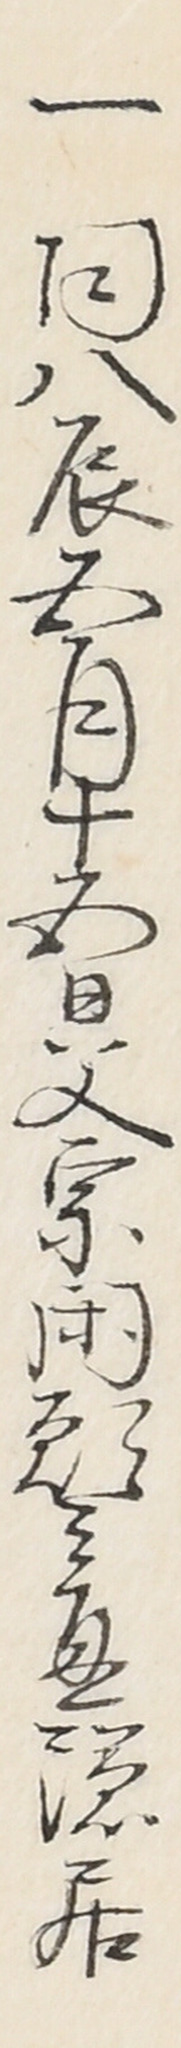一同八辰五月十五日父宗閑願之通隠居
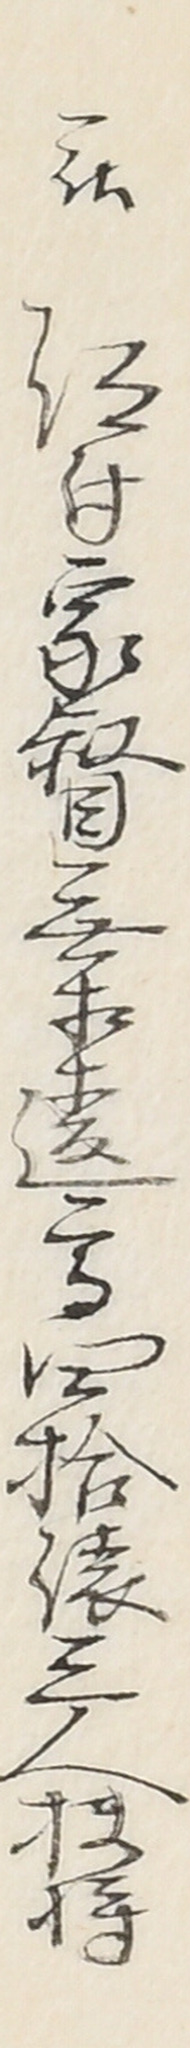被仰付家督無相違高四拾俵三人扶持
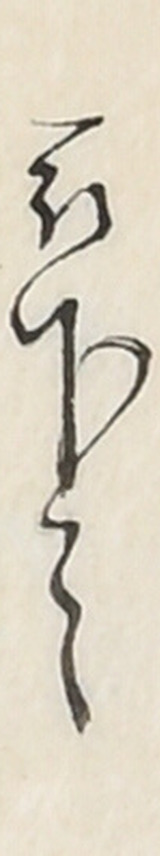被下之
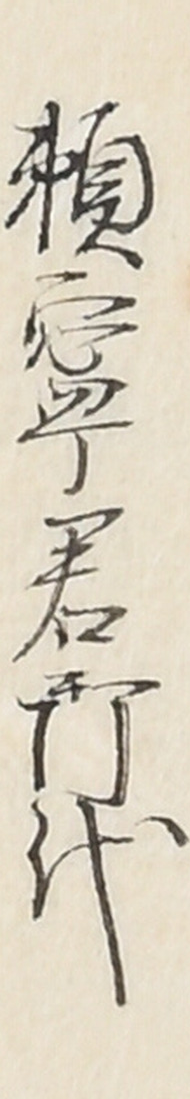頼以君御代
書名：給人諸士勤仕録（七）
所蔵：伊那市立高遠町図書館・合同会社AMANE
